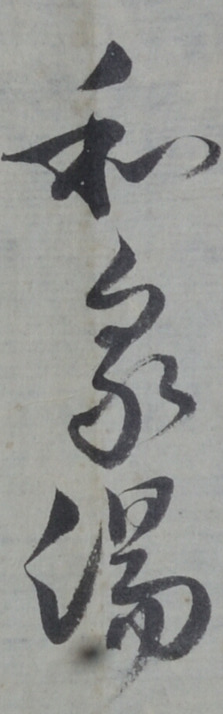和泉湯

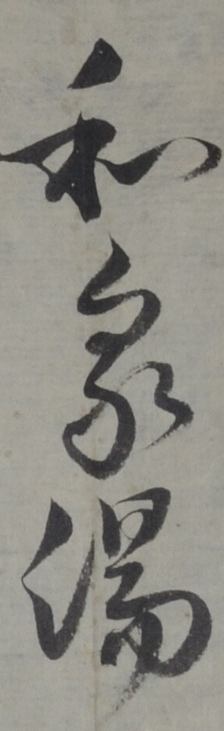和泉湯
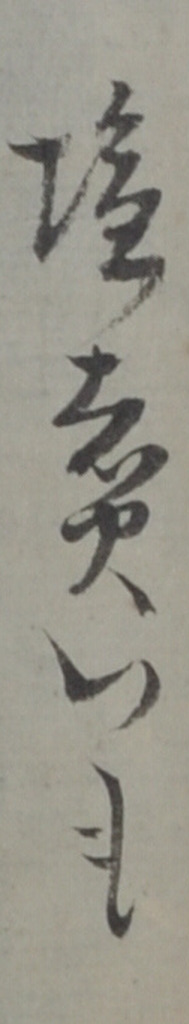塩煮いも
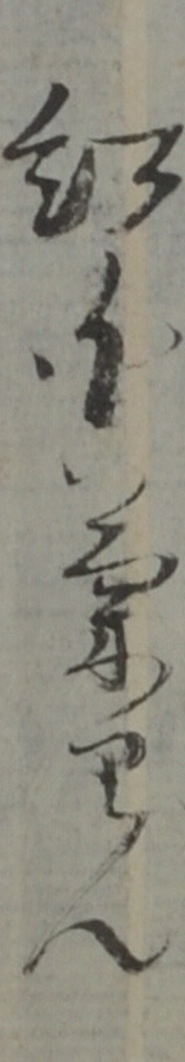紅白菊わん
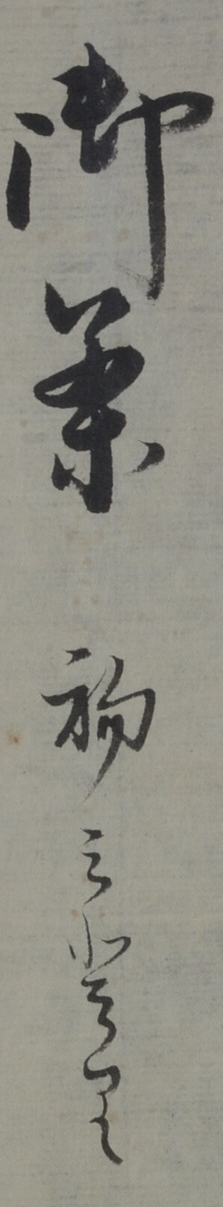御茶初みとり

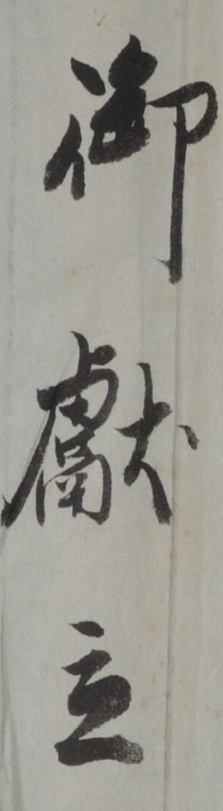御献立
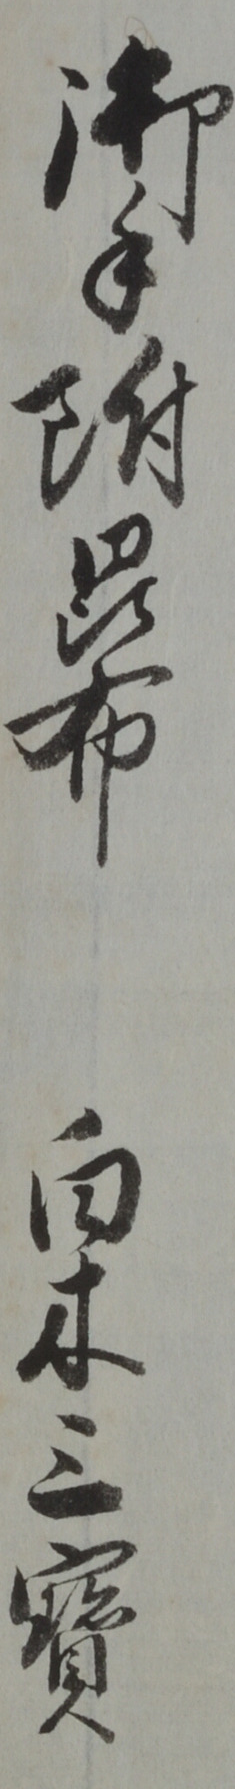御手附昆布白木三宝
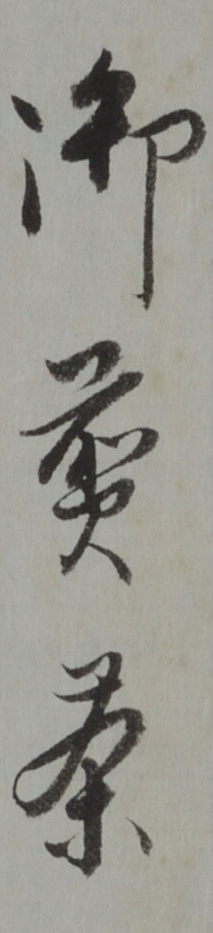御煎茶
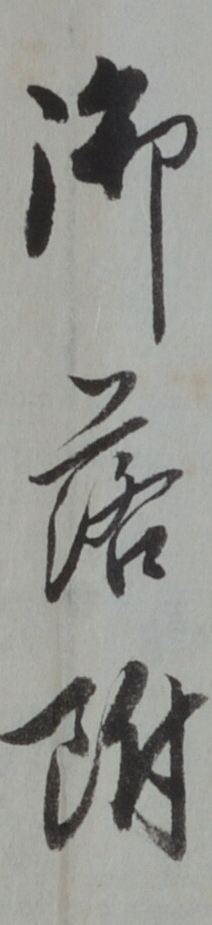御落附
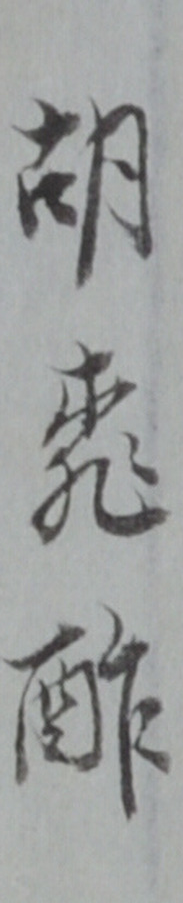胡桃酢
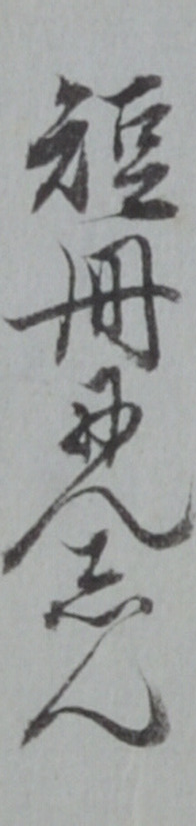短冊にんしん
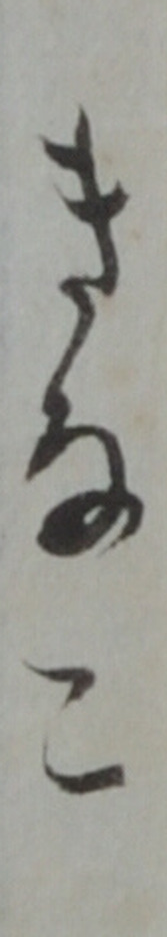きなこ
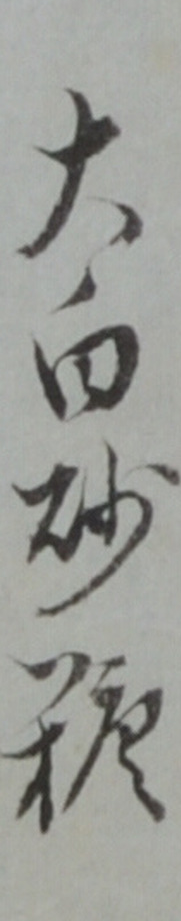大白砂糖

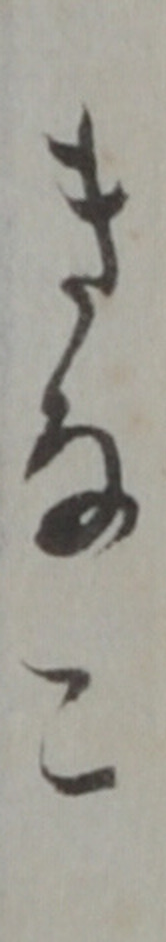きなこ
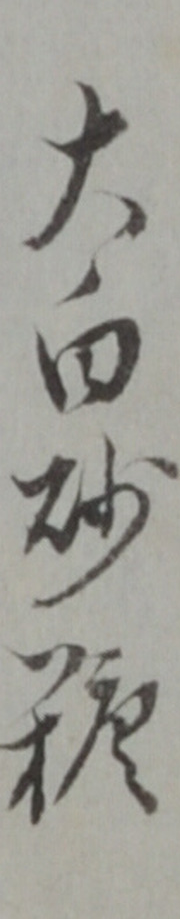大白砂糖
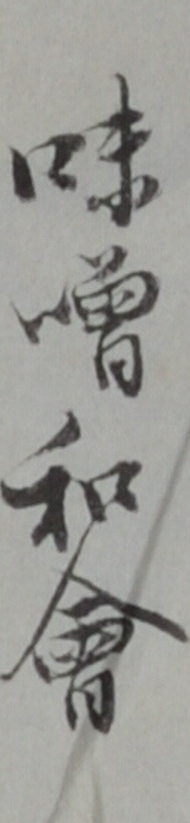味噌和会
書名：献立書上
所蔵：伊那市立高遠町図書館・合同会社AMANE
